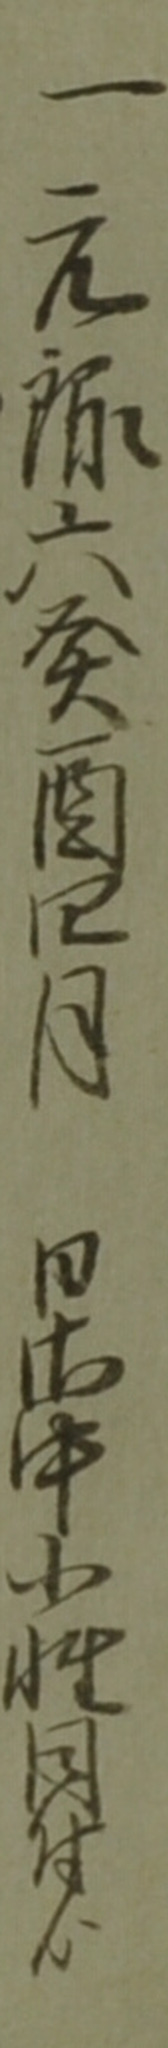一元禄六癸酉四月日御中小性目付ゟ
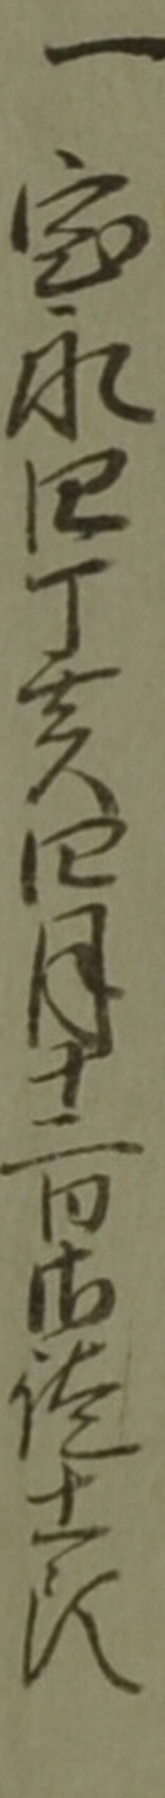一宝永四丁亥四月十二日御徒士頭
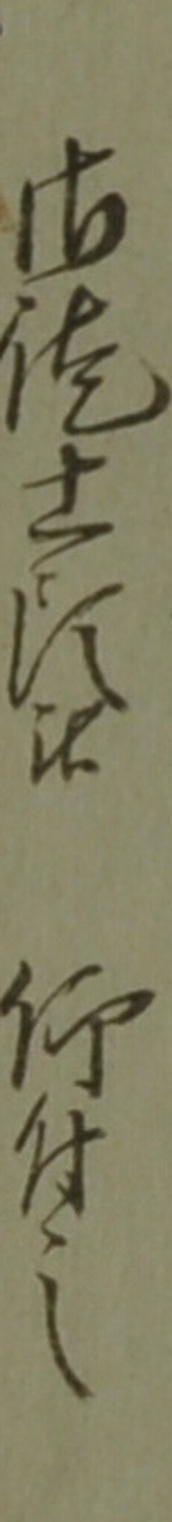御徒士頭被仰付之
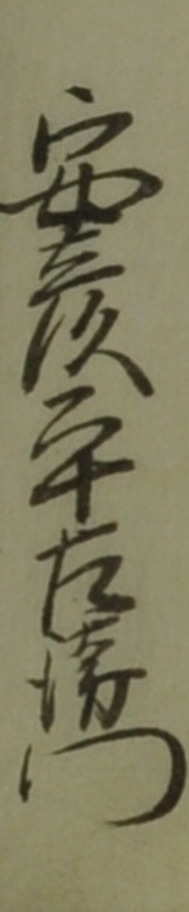安彦平左衛門
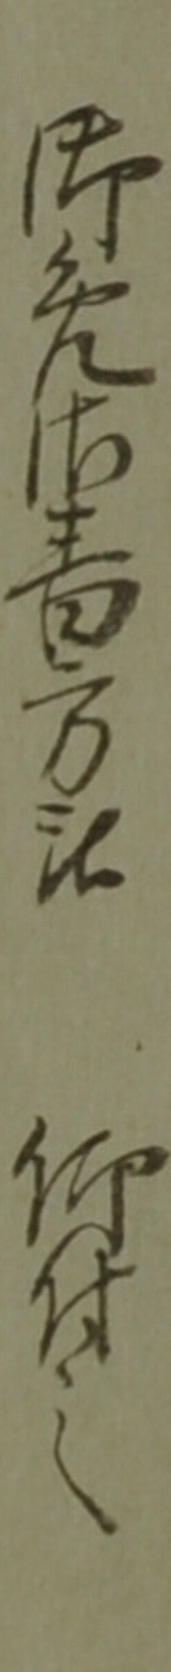御免御番方被仰付之
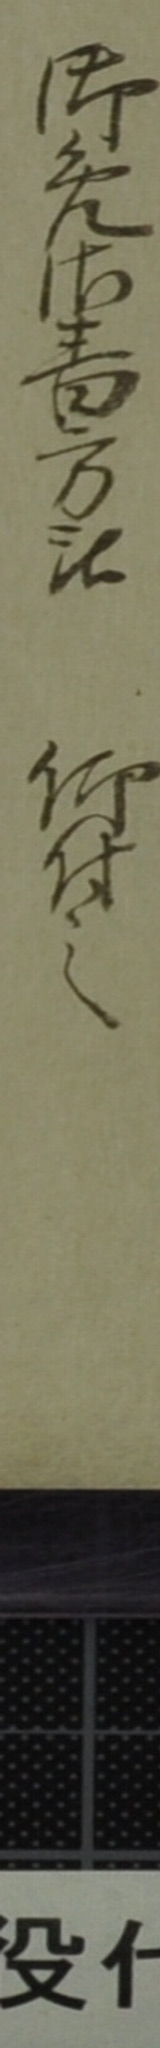御免御番方被仰付之
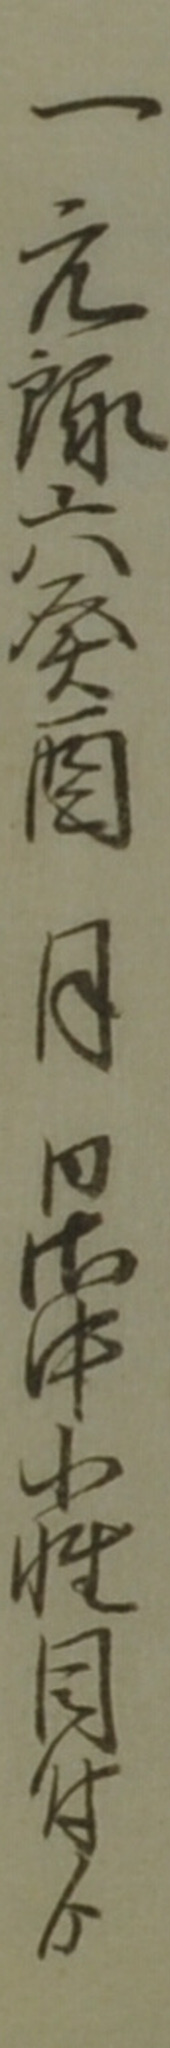一元禄六癸酉月日御中小性目付ゟ
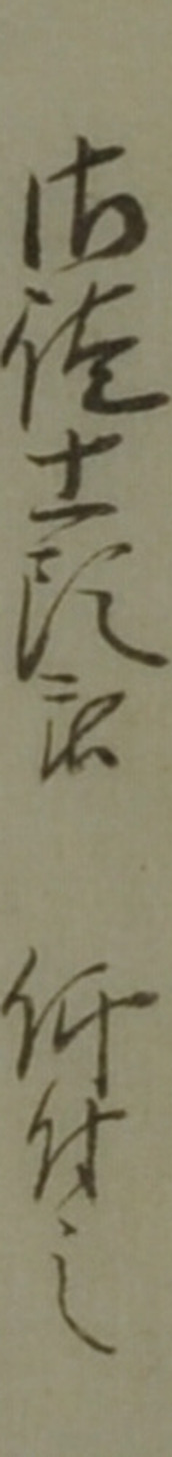御徒士頭被仰付之
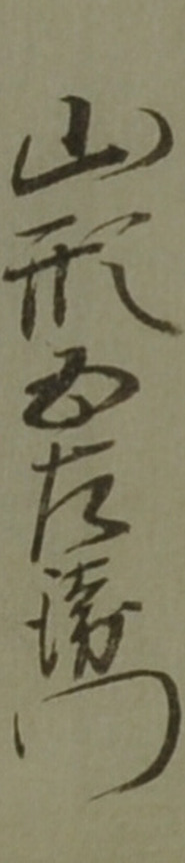山形五左衛門
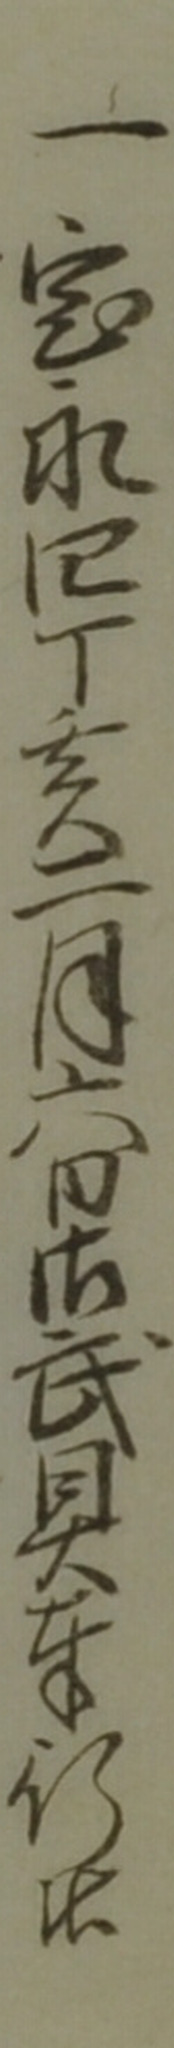一宝永四丁亥二月六日御武具奉行被
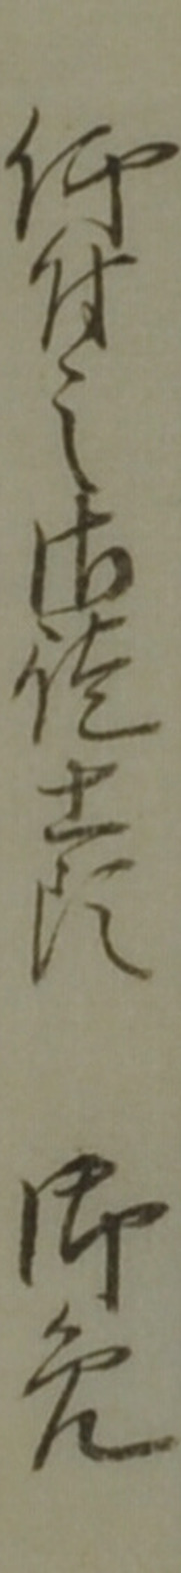仰付之御徒士頭御免
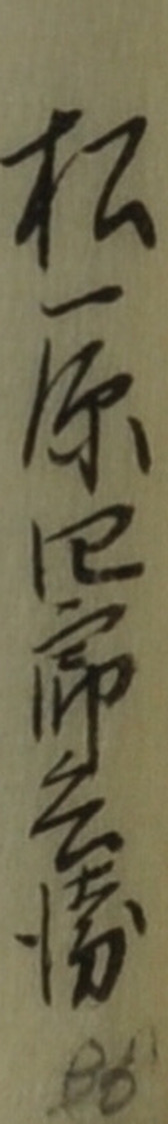松原四郎兵衛
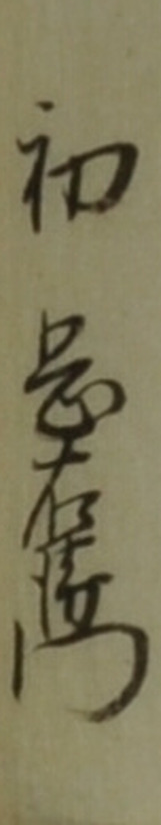初岡右衛門
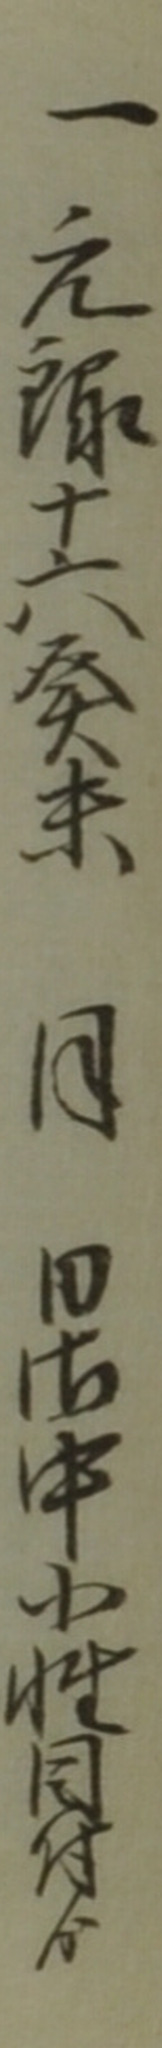一元禄十六癸未月日御中小性目付ゟ
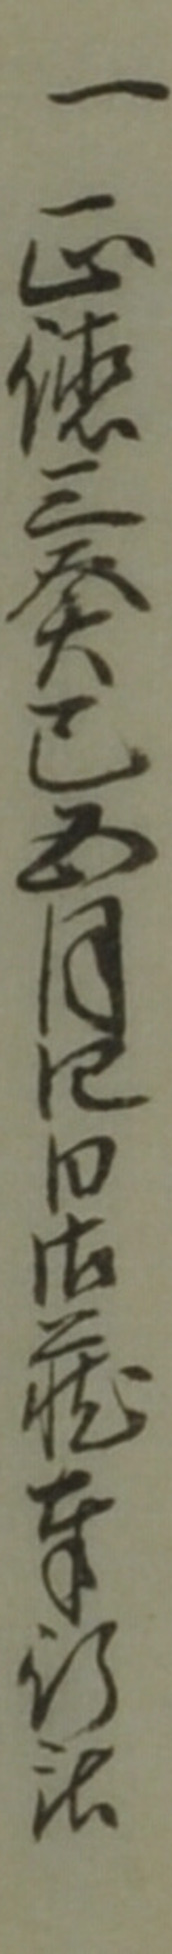一正徳三癸巳五月四日御蔵奉行被
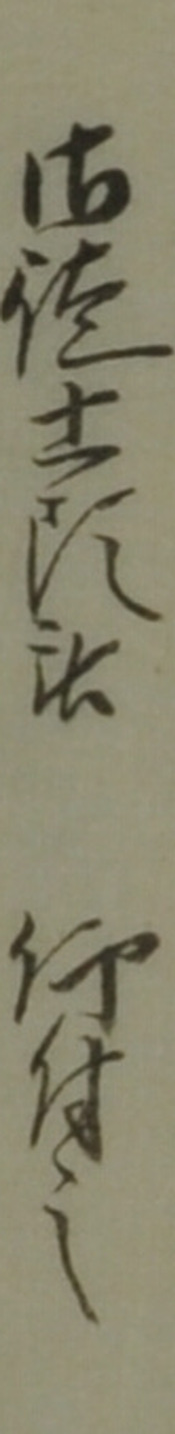御徒士頭被仰付之
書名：諸御役代々録（六）
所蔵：伊那市立高遠町図書館・合同会社AMANE
